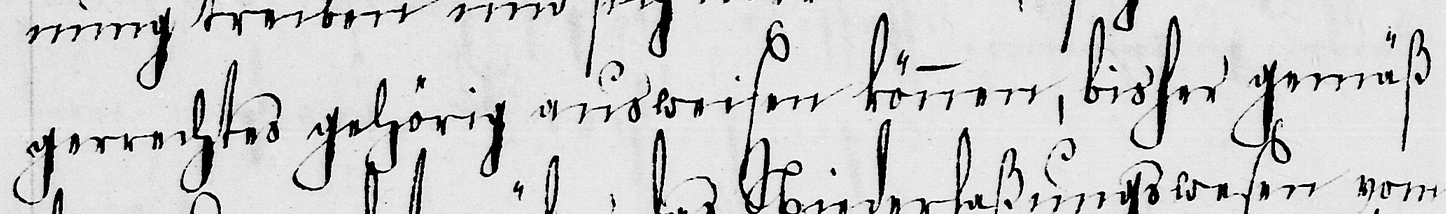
gerrechtes gehörig ausweisen können, bisher gemäß
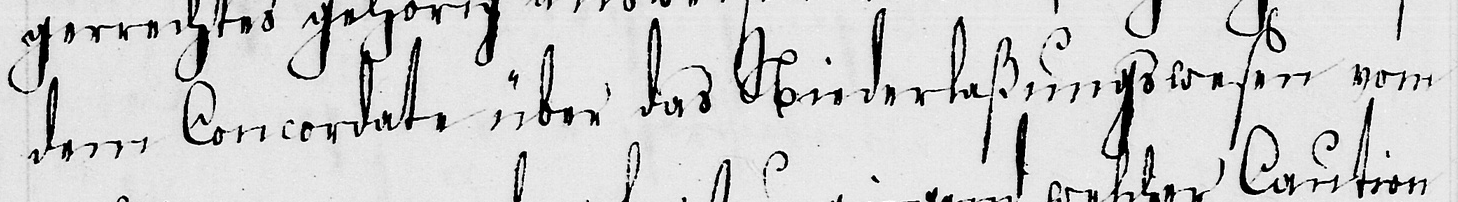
dem Concordate über das Niederlassungswesen vom
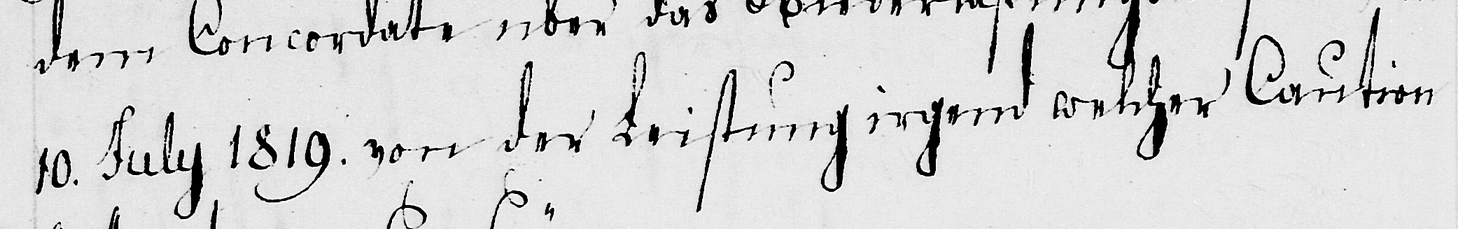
10. July 1819. von der Leistung irgend welcher Caution
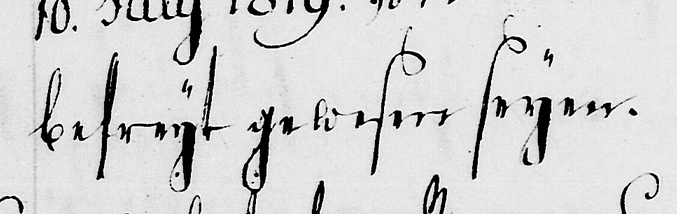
befreyt gewesen seyen.
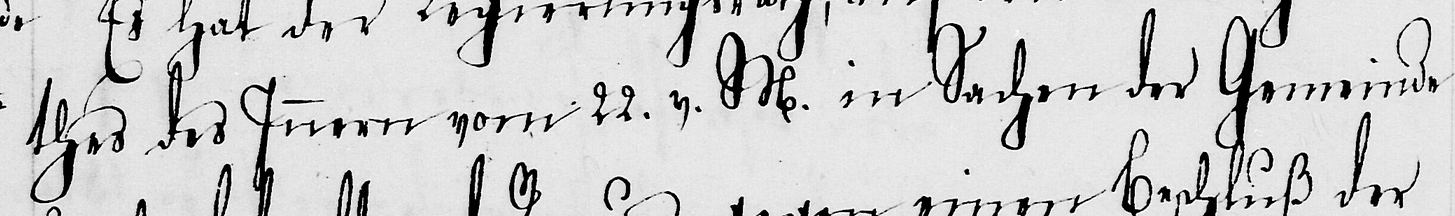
thes des Innern vom 22. v. M. in Sachen der Gemeinde
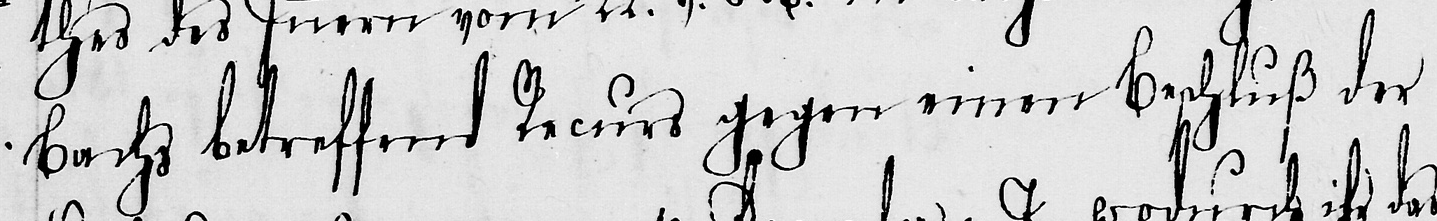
Bachs betreffend Recurs gegen einen Beschluß der
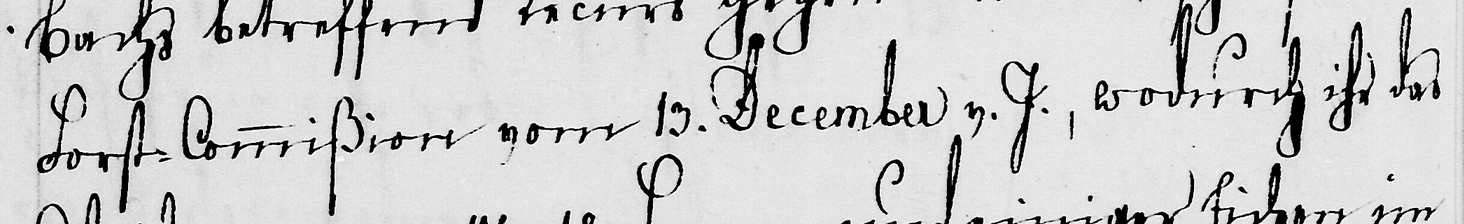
Forst-Commißion vom 13. December v. J., wodurch ihr das
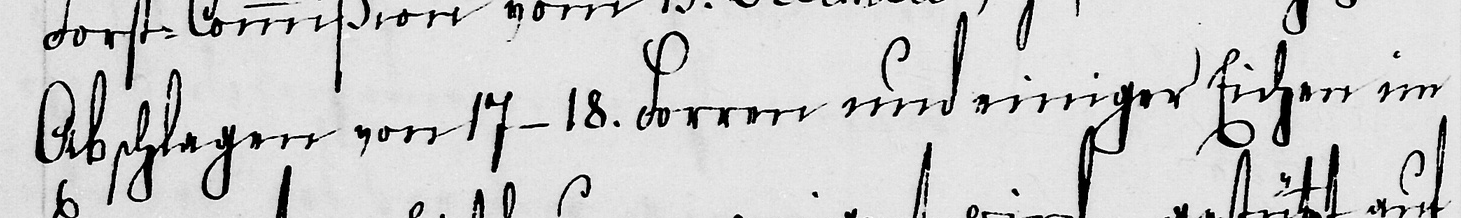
Abschlagen von 17-18. Forren und einiger Eichen im
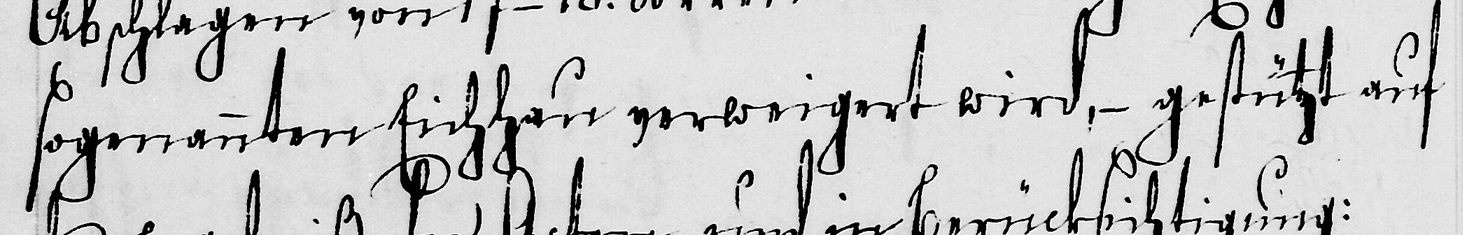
sogenannten Eichhau verweigert wird, – gestützt auf
